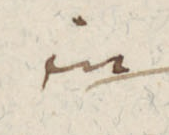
erhielten,
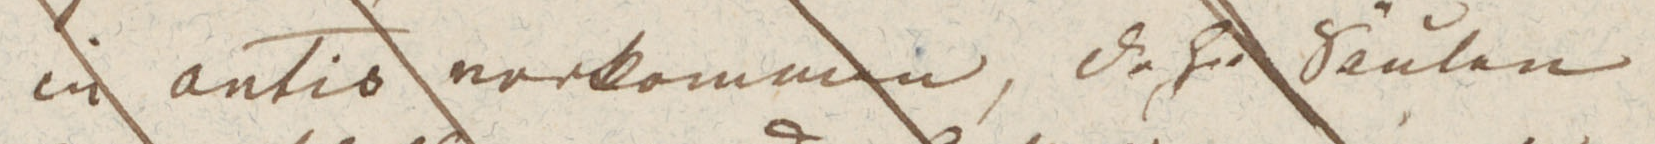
in antis vorkommen, da Säulen
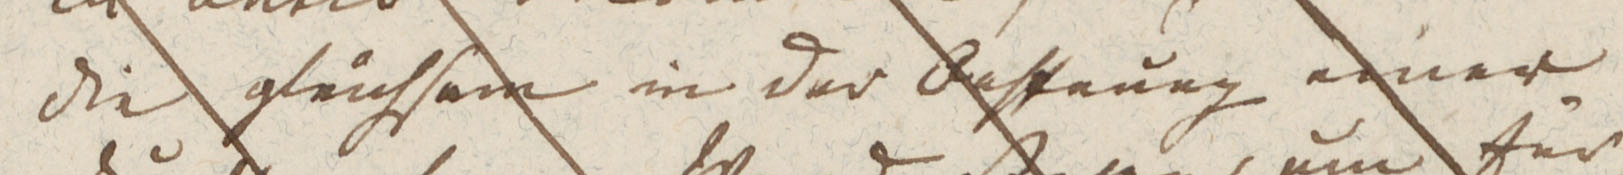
die gleichsam in der Oeffnung einer
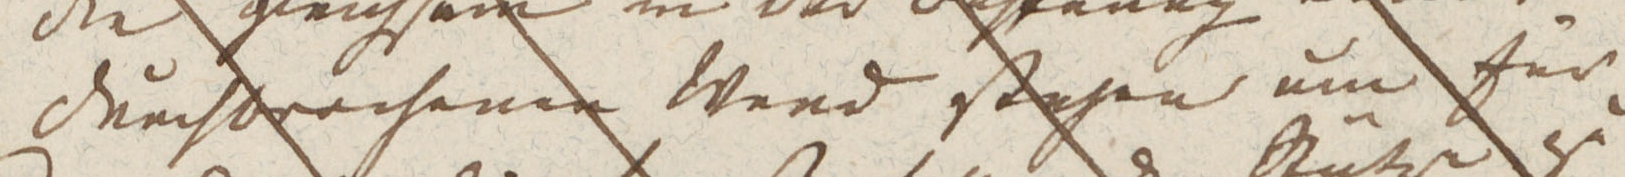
Durchbrochenen Wand stehen um für
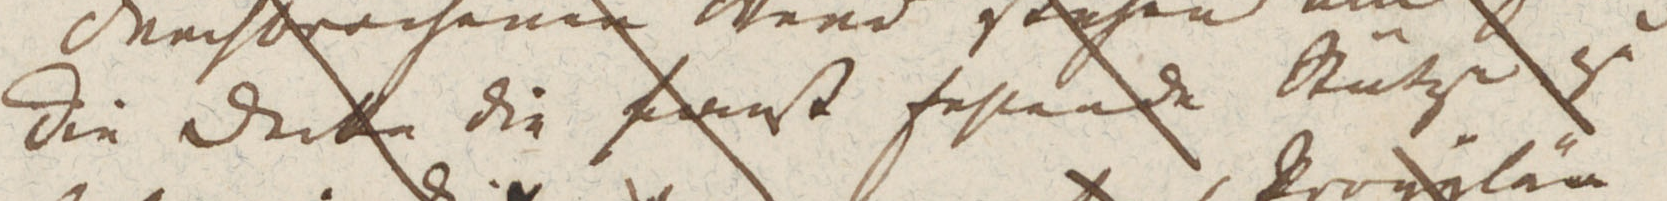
die Decke die sonst fehlende Stütze zu
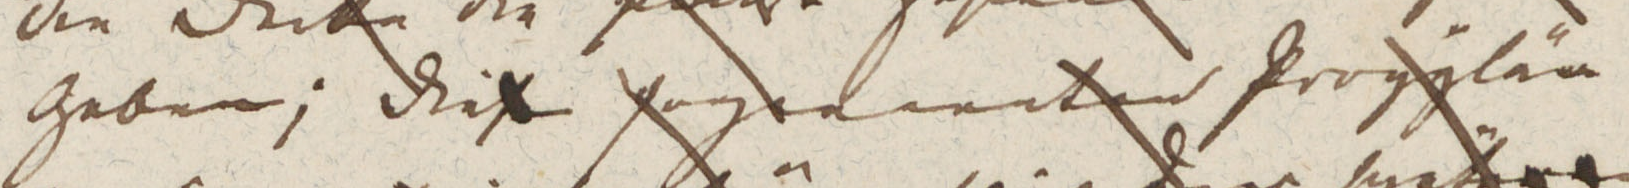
geben; Diese sogenannten Propyläe
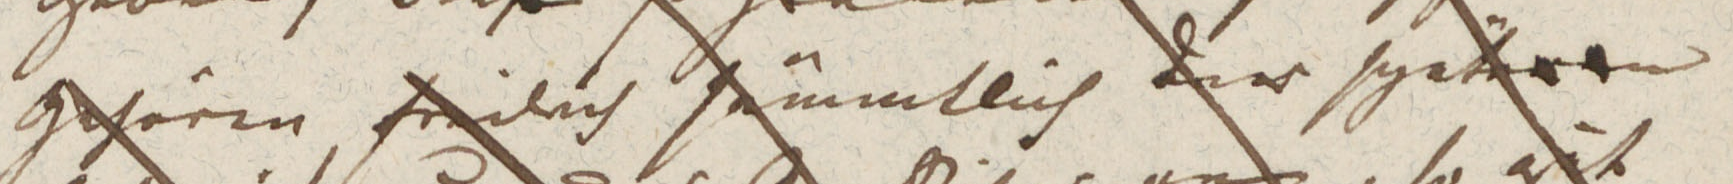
gehören freilich sämmtlich der späteren
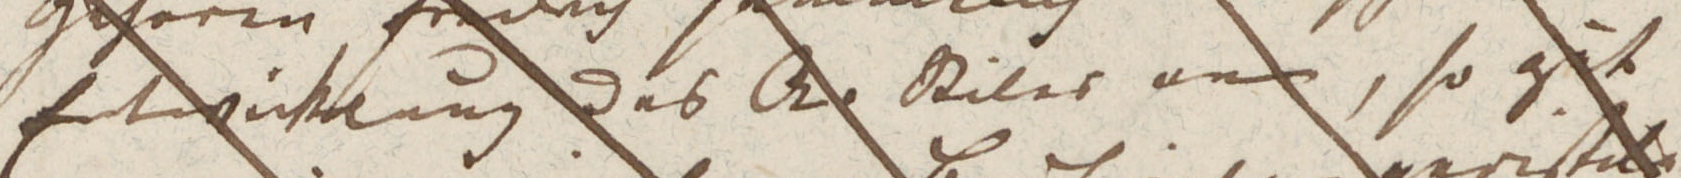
Entwicklung des A. Stiles an, so gut
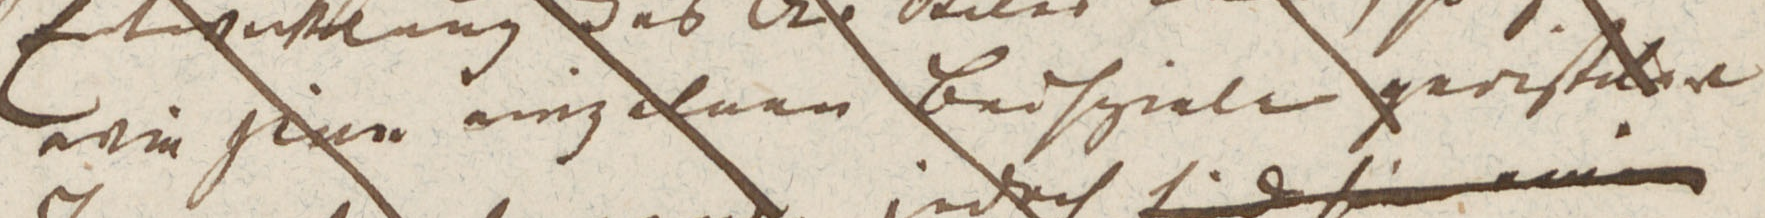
wie jene einzelnen Beispiele peristiler
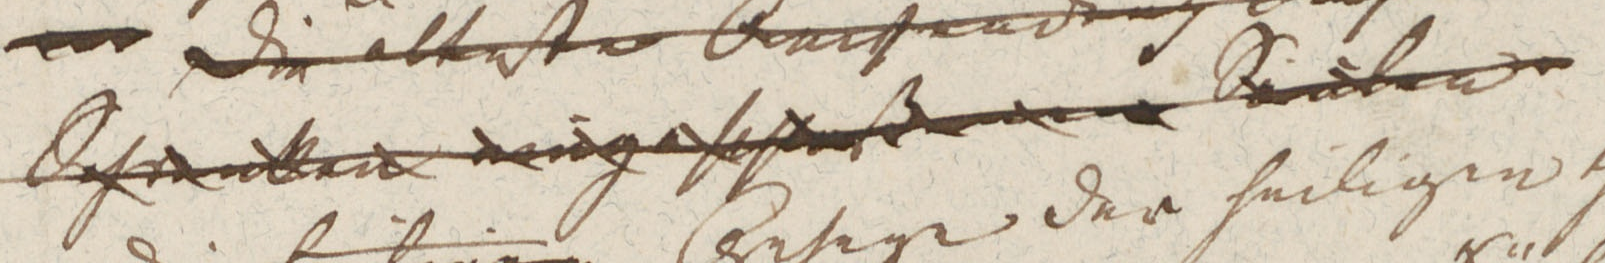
Schranken eingeschlossenen Säulen..
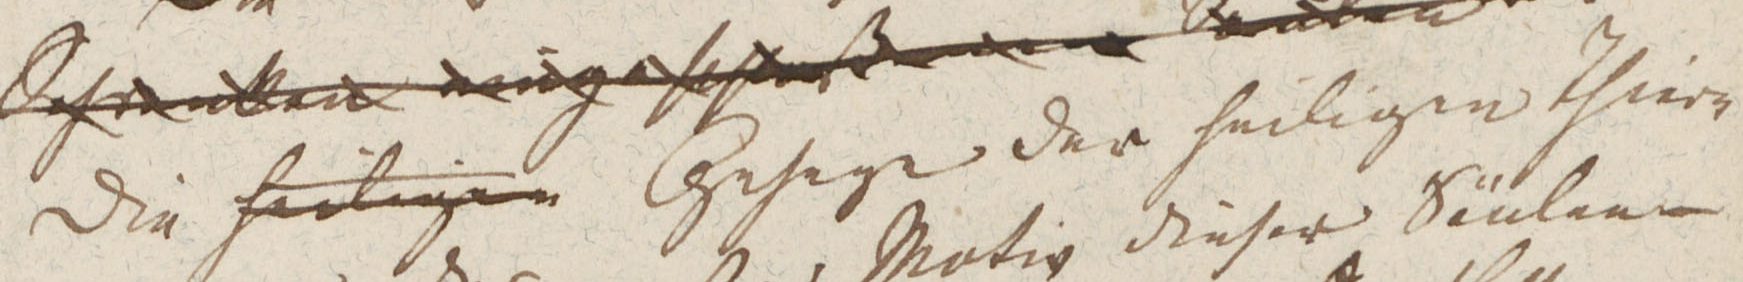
Die heiligen Gehege der heiligen Thiere
